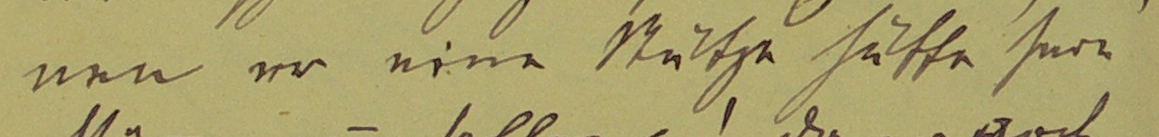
nen er eine Stütze hätte sein
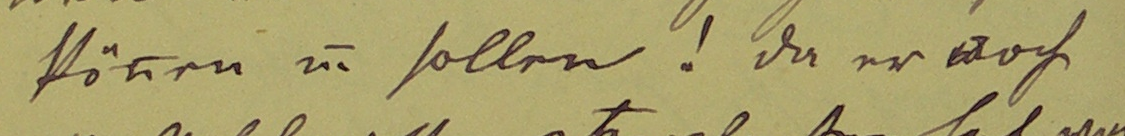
können und sollen ! Da er noch
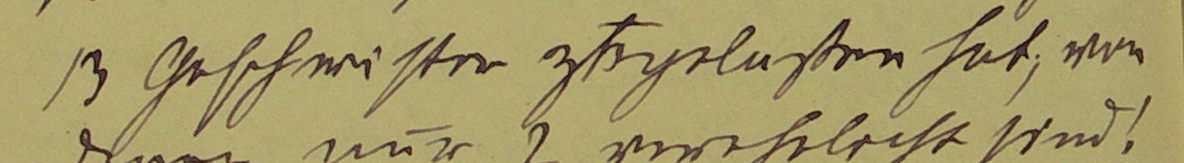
13 Geschwister zurückgelassen hat, von
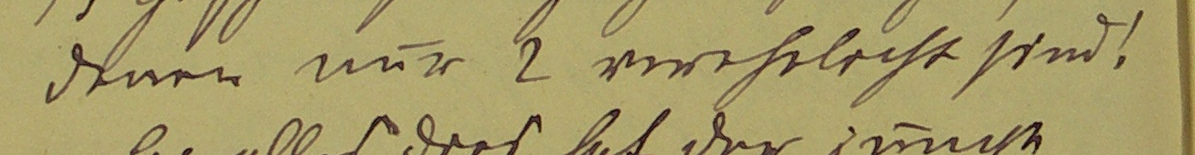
denen nur 2 verehelicht sind!
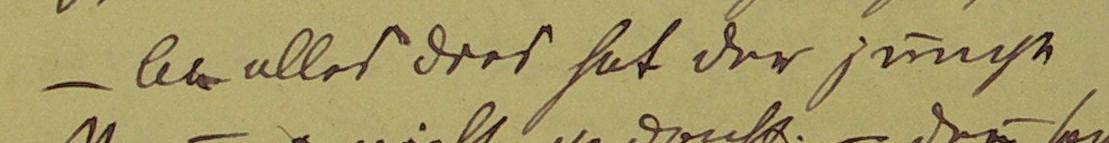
–An alles das hat der junge
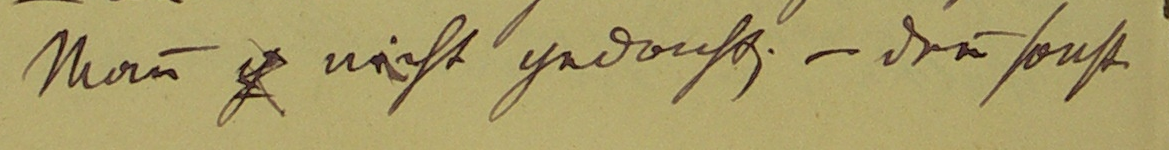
Mann nicht gedacht. Denn sonst
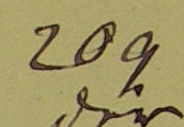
209
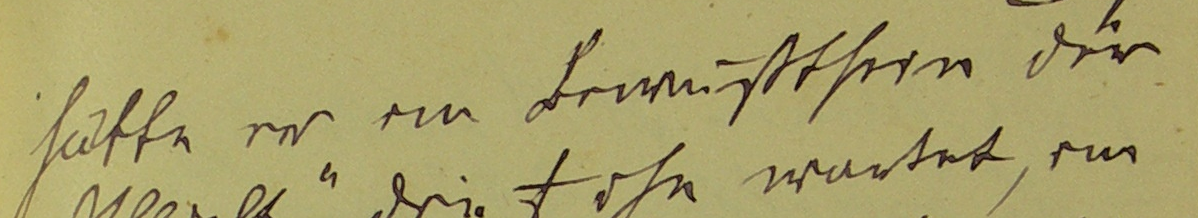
hätte er im Bewußtsein der
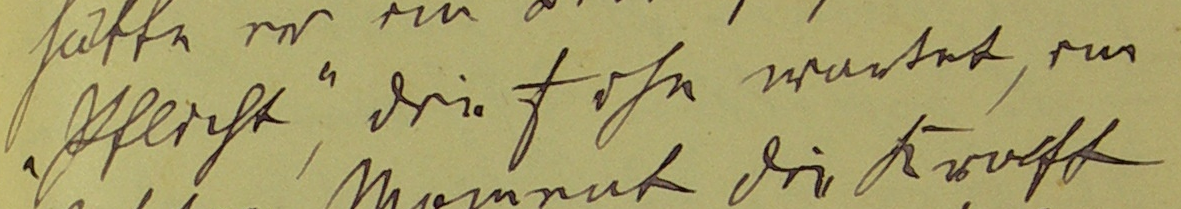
„Pflicht“, die auf ihn wartet, im
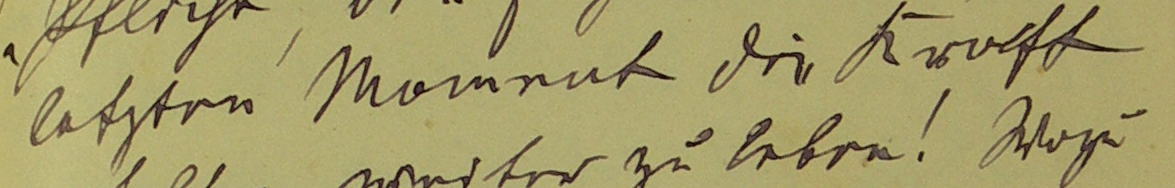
letzten Moment die Kraft
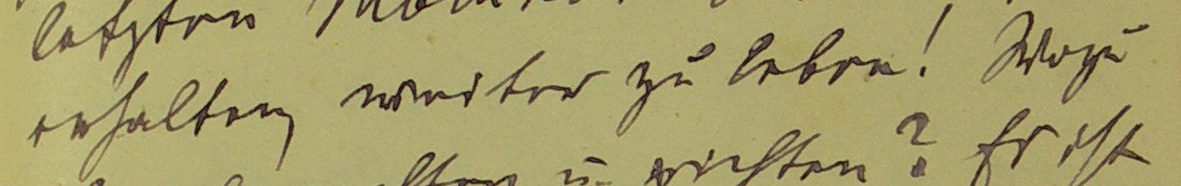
erhalten weiter zu leben!- Wozu
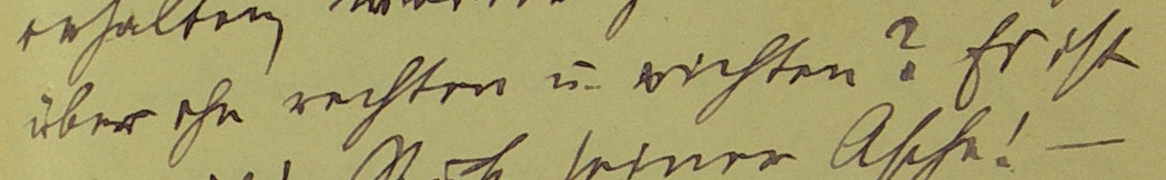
über ihn richten und wichten ? Es ist
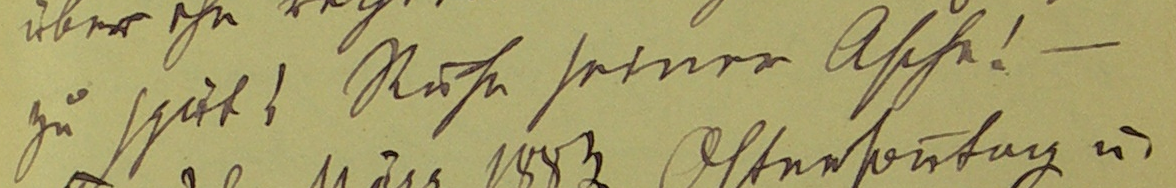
zu spät! Ruhe seiner Asche! -
